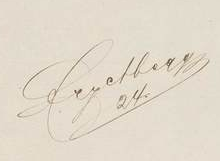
Zürich,
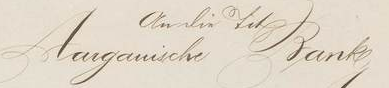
Aargauische Bank
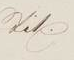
Tit.
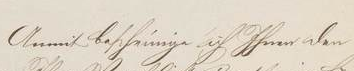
Anmit bescheinige ich Ihnen den
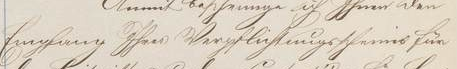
Empfang Ihres Verpflichtungsscheines für
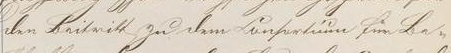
den Beitritt zu dem Consortium für Be-
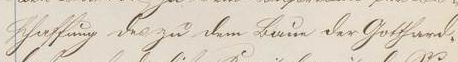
schaffung des zu dem Baue der Gotthard -
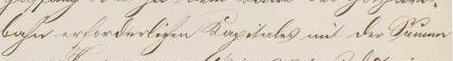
bahn erforderlichen Kapitales mit der Summe
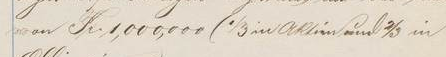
von Fr 1,000,000 (⅓ in Aktien und ⅔ in
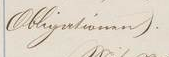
Obligationen).
